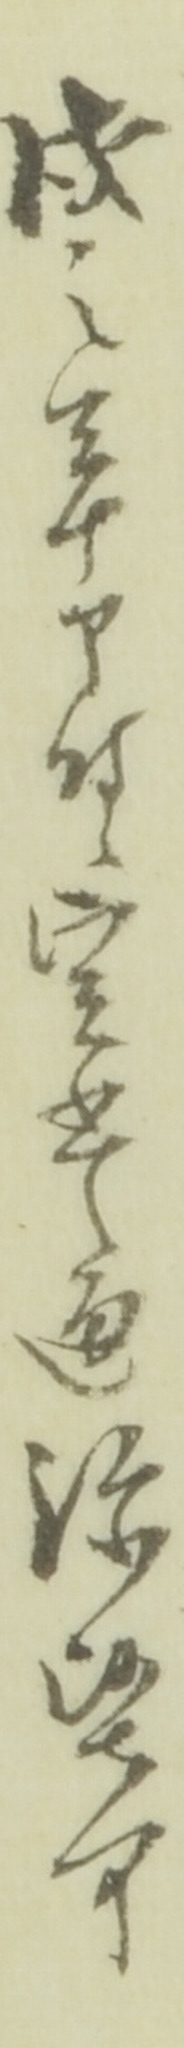成之年申付候定書候通添望可
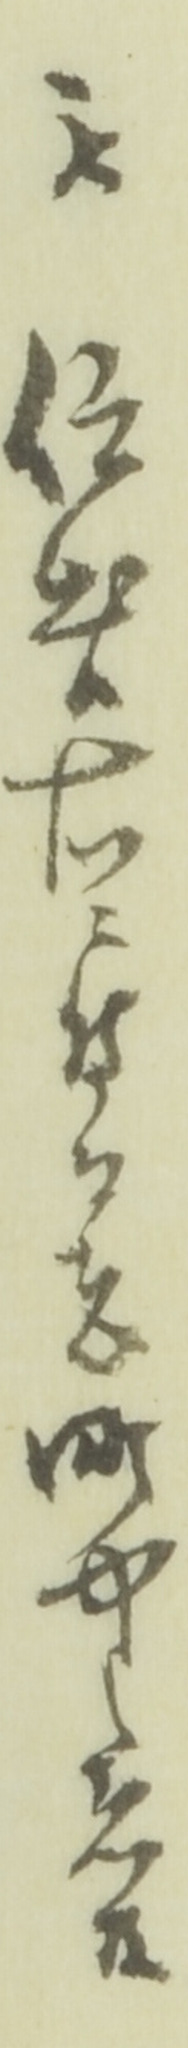被仰出候右二付候者町中之者共
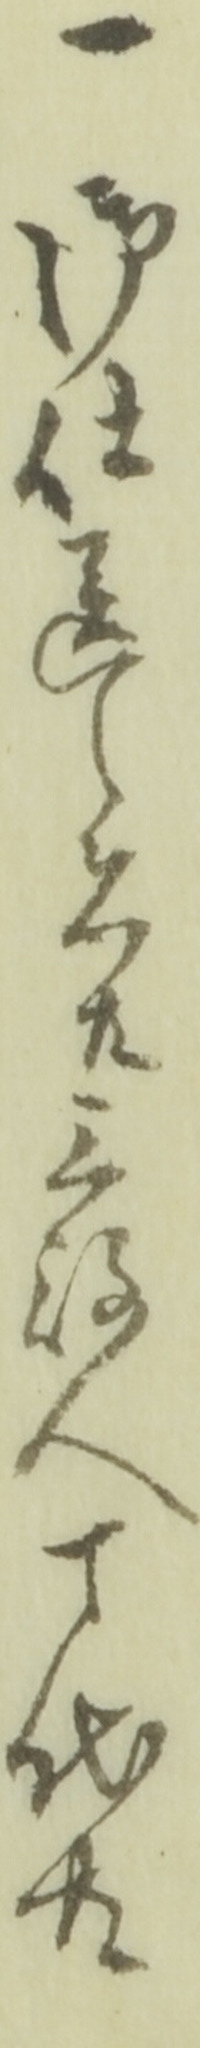一御仕送之者共三役人丁代共
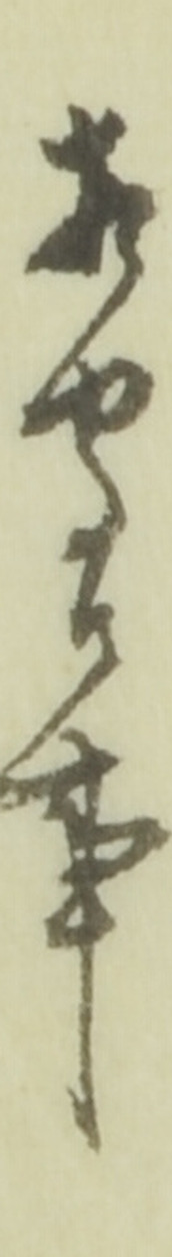相聞候事
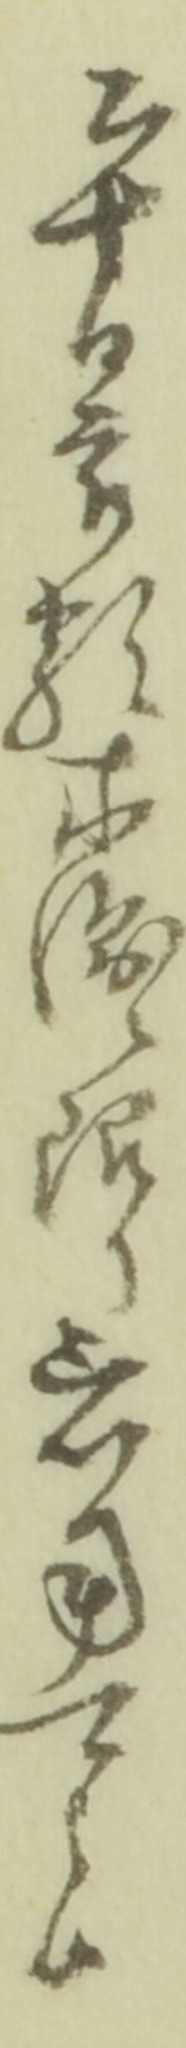二十日衣類等渡候限り着用可申候
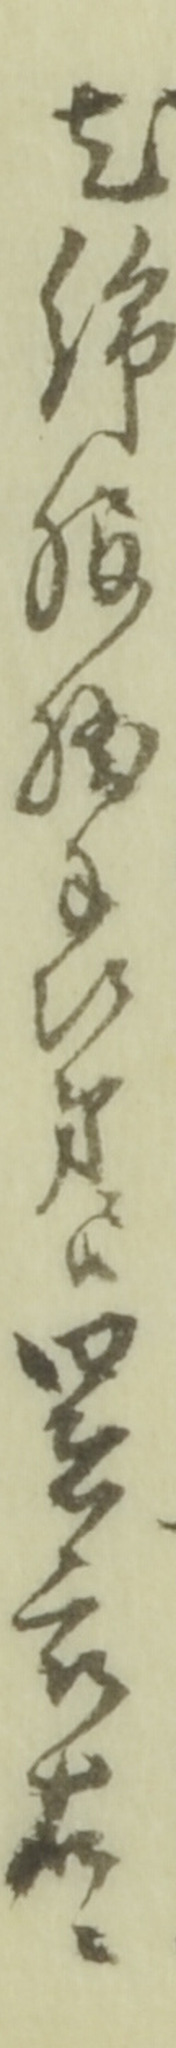尤綿服勝手次第二候御懸衣着二
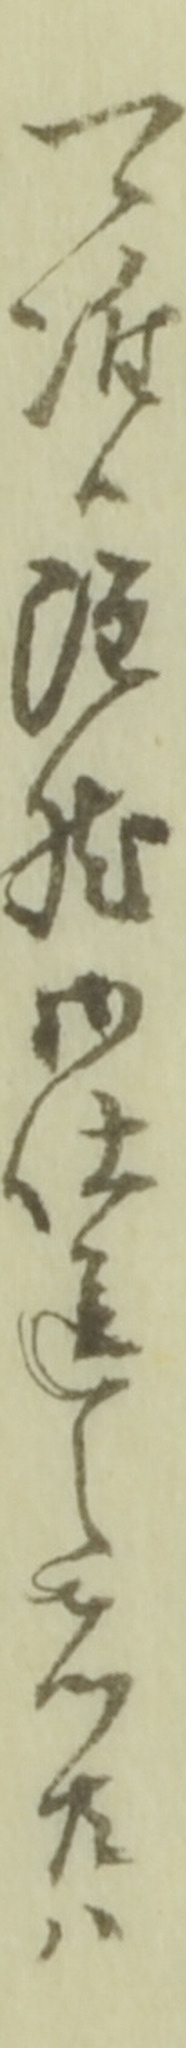可准候雖然御仕違候者共ハ
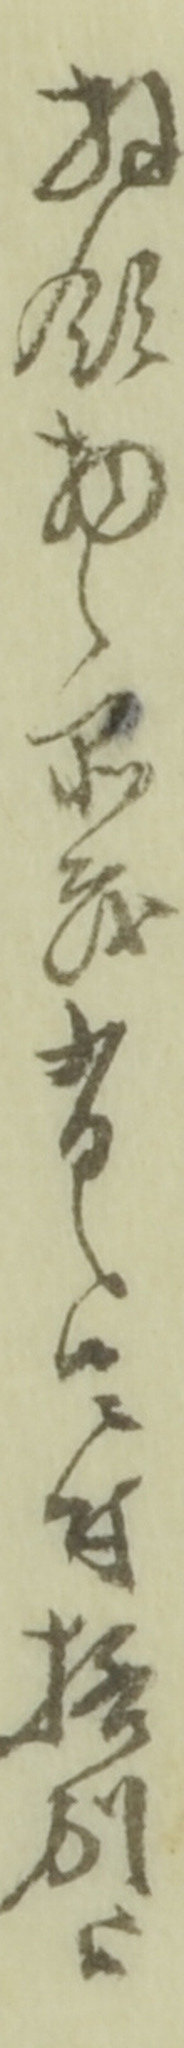拝領者之品茂有之候二付格別二
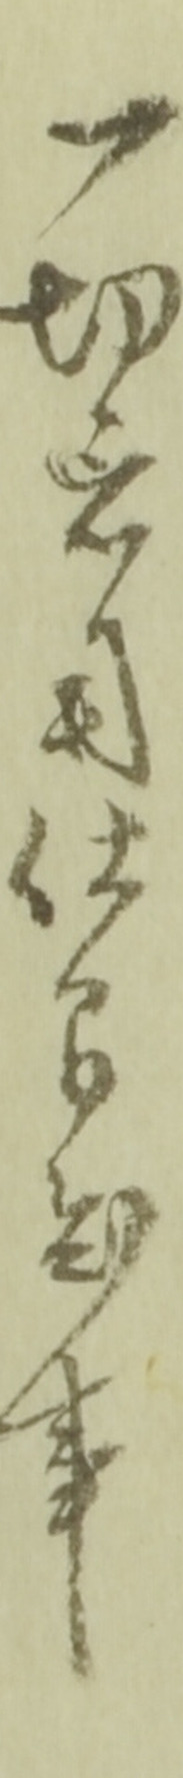一切着用仕間敷事
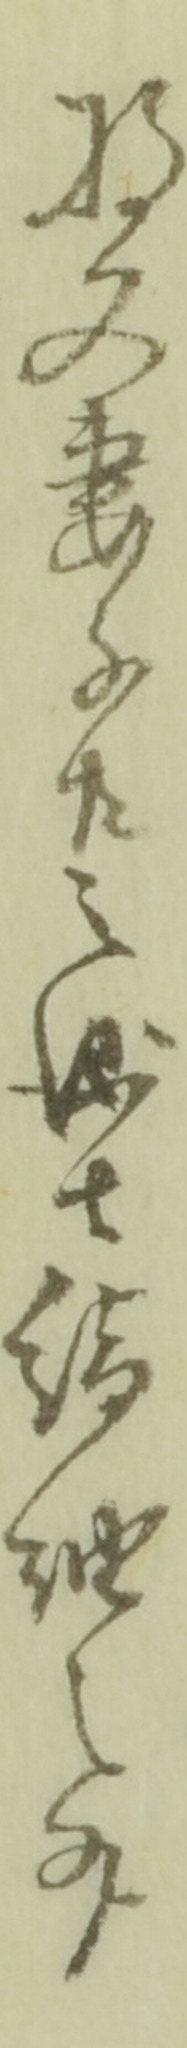持又妻子共之儀者絹之外
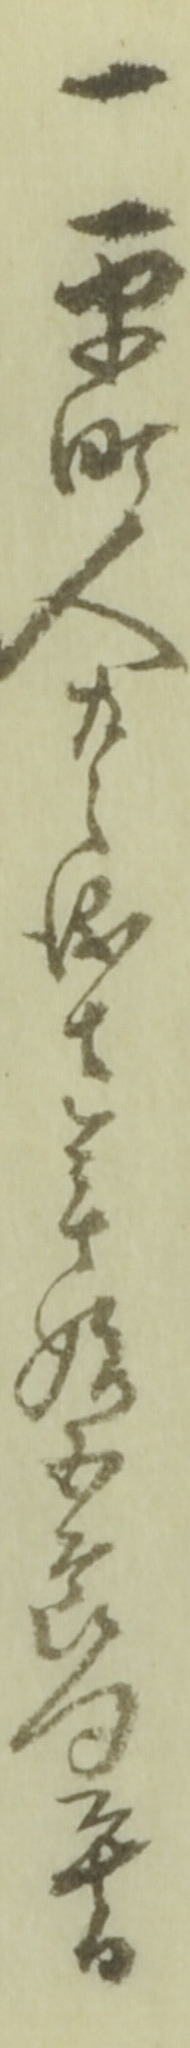一東町人共之儀者年始め五節句
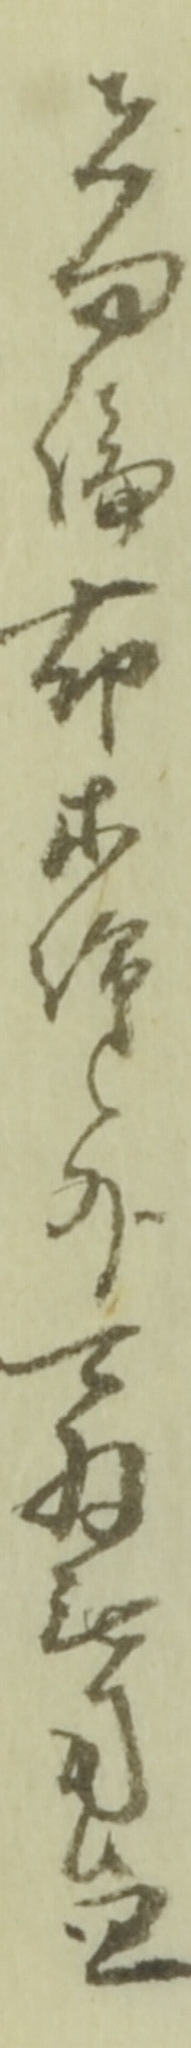者向後布等綿之外可為無用候且
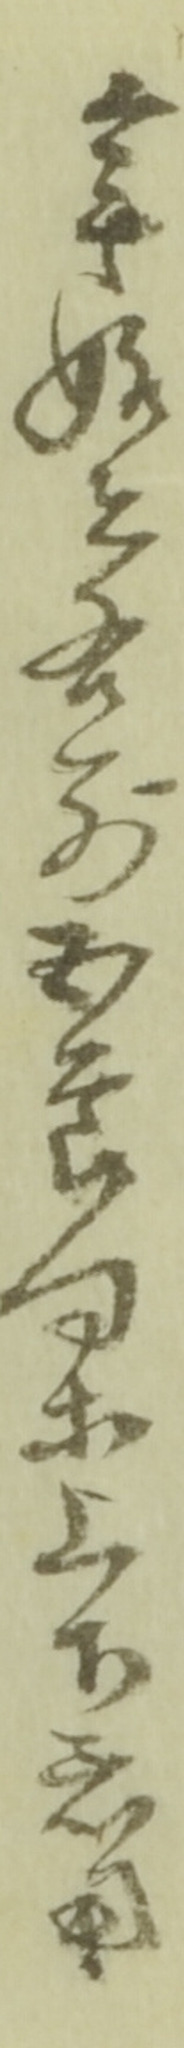年始と盆前五節句など上下着用
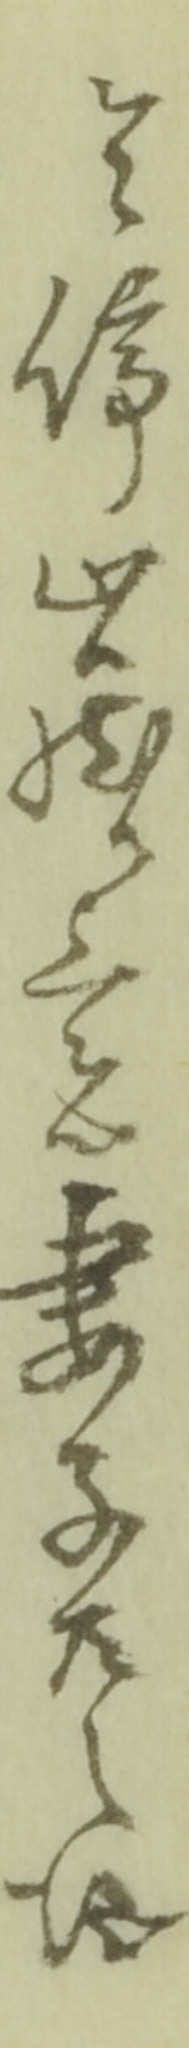令停止候然ル上者妻子共之儀
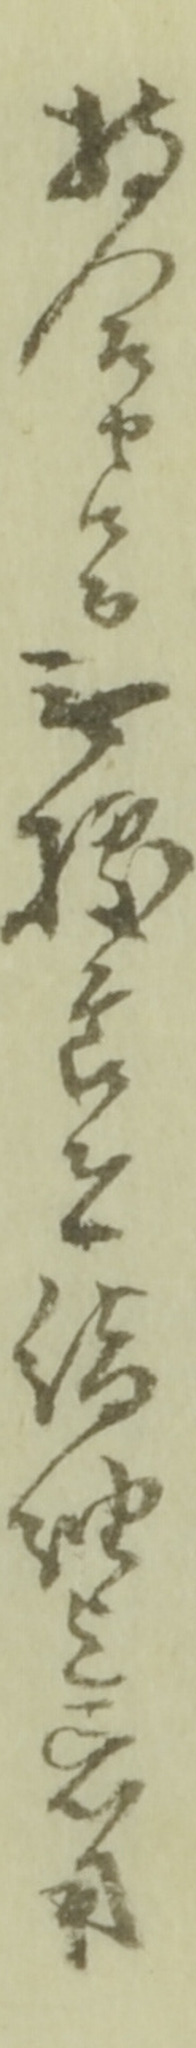持合セ候而無拠節者絹紬迄着用
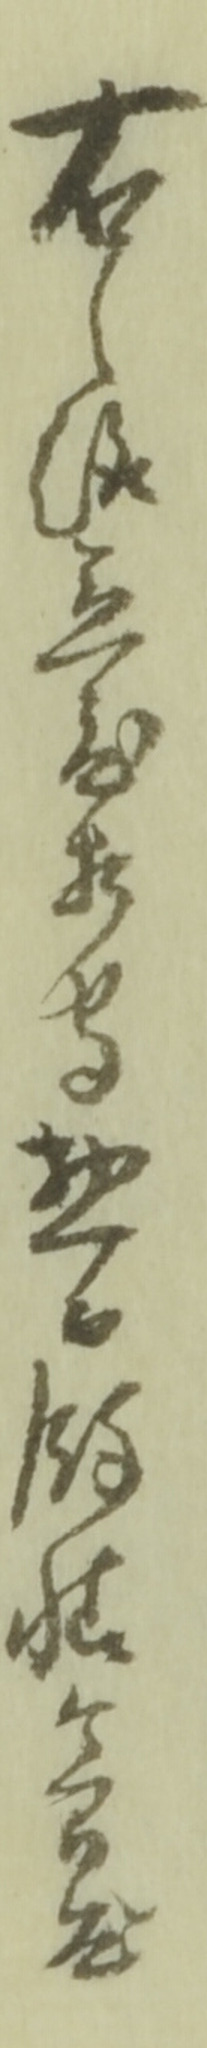右之趣急度相守惣而慎候間敷
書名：御公儀様御領主様御触書控
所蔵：伊那市立高遠町図書館・合同会社AMANE
